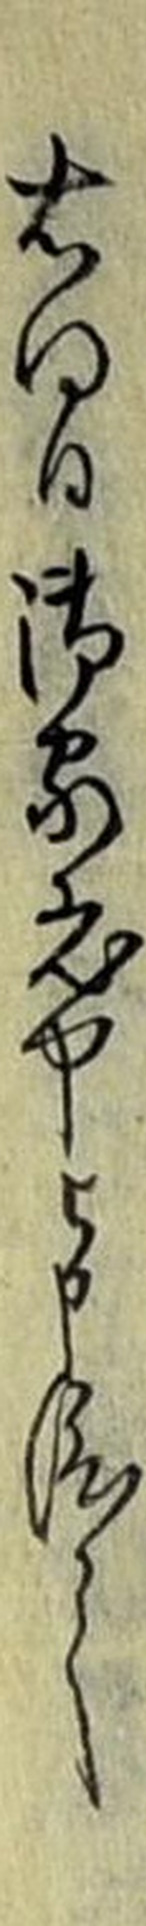右同日御家老中被申渡之
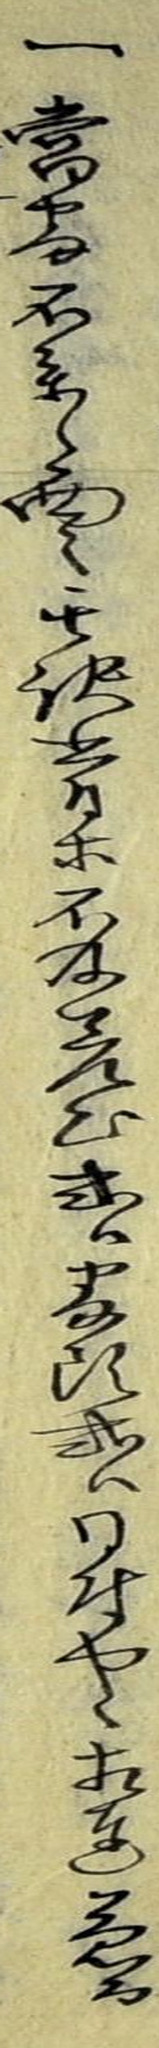一当番不参之面々其訳書付等不及差出或ハ番頭或ハ目付中へ相達兼而
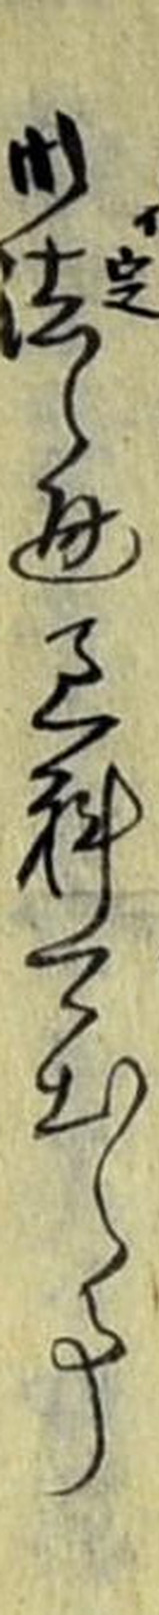御法之通過料可出事
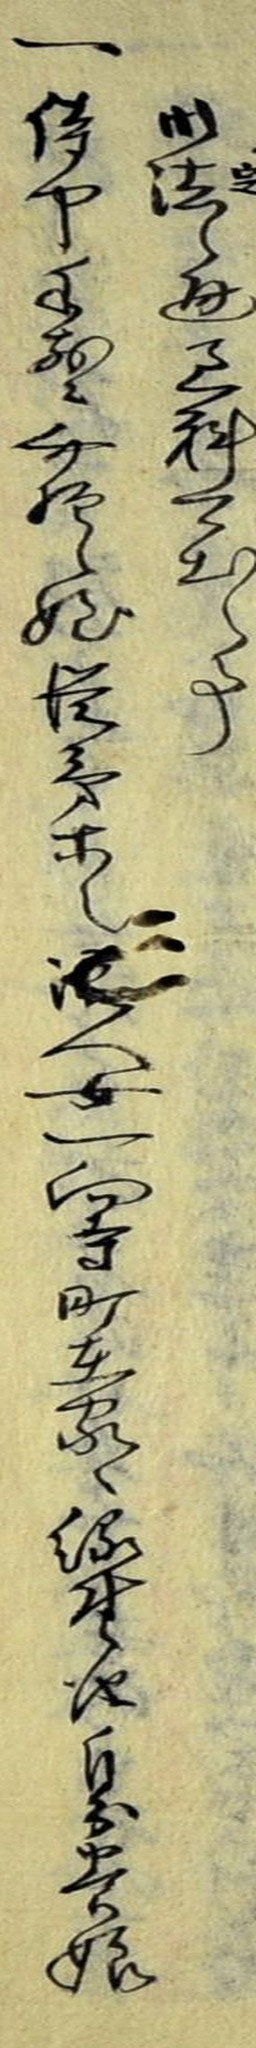一侍中手前ニ介抱之姪従弟等之人女一向寺町在家へ縁付候儀自分養娘

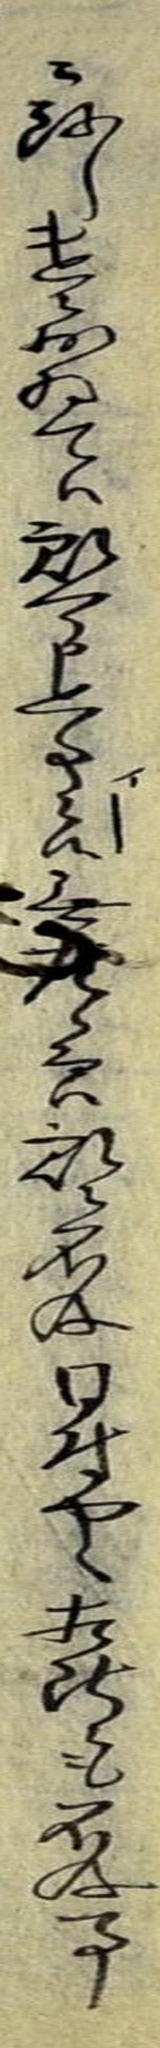ニ致し遣ニおゐてハ願可申上事ニ候無左候而ハ願ニ不及目付中へ相断ニも不及事
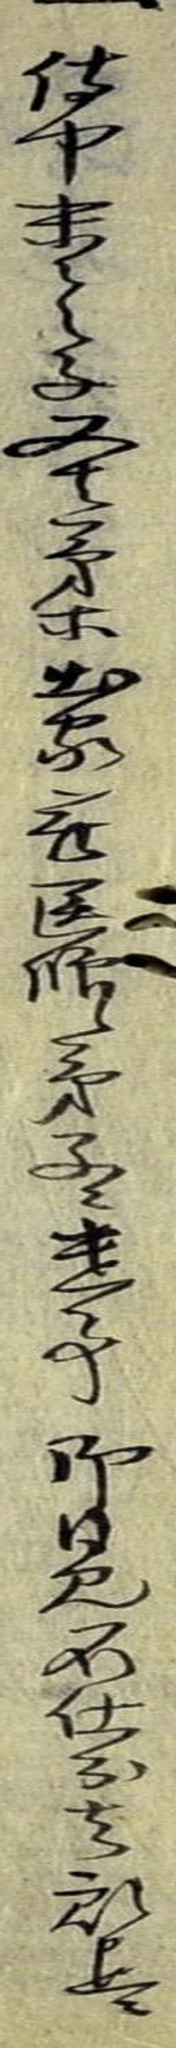一侍中末々之子又者弟等出家并医師へ弟子ニ遣事御目見不仕分者願申上ニ
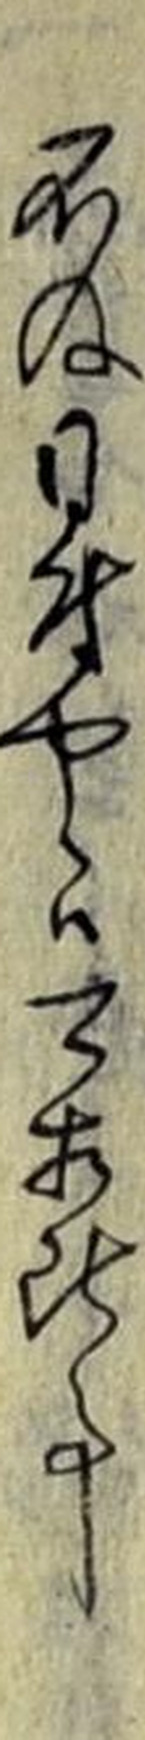不及目付中へハ可相断事
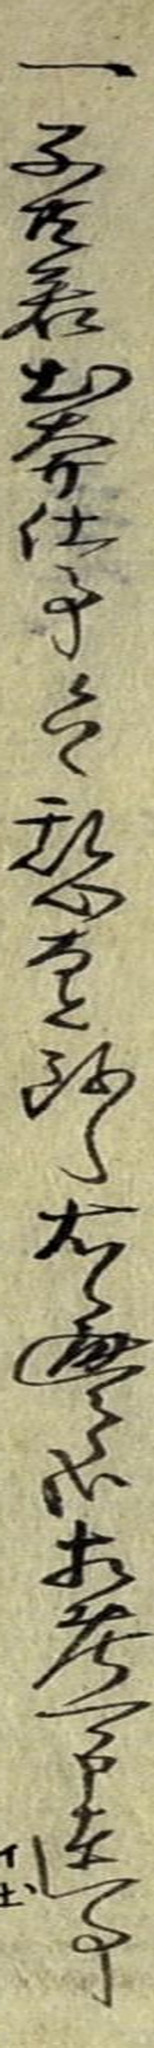一子共若出奔仕事候ハヽ乱心なと致し候右之通ニ候哉相考可申達事
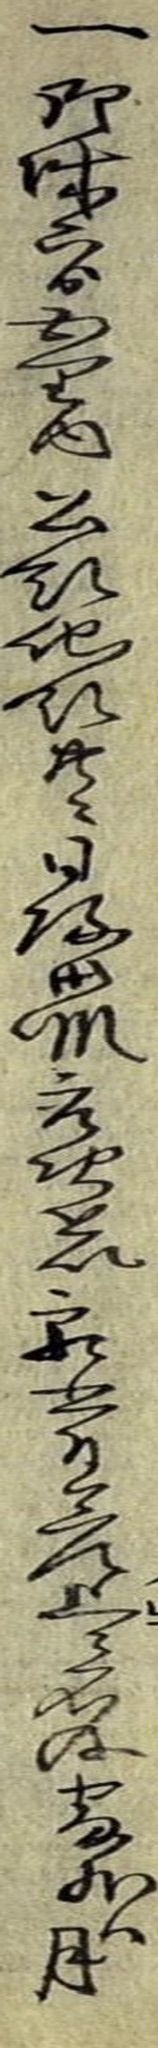一御城下ゟ五里内公領他領共ニ日帰御暇取次を以願書付差上ニ不及番外ハ月
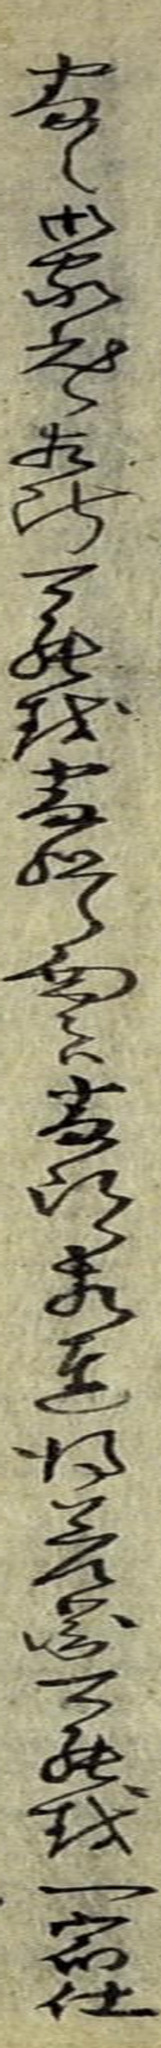番之御家老へ相断可罷越番組之面々ハ番頭へ相達得差図可罷越一宿仕
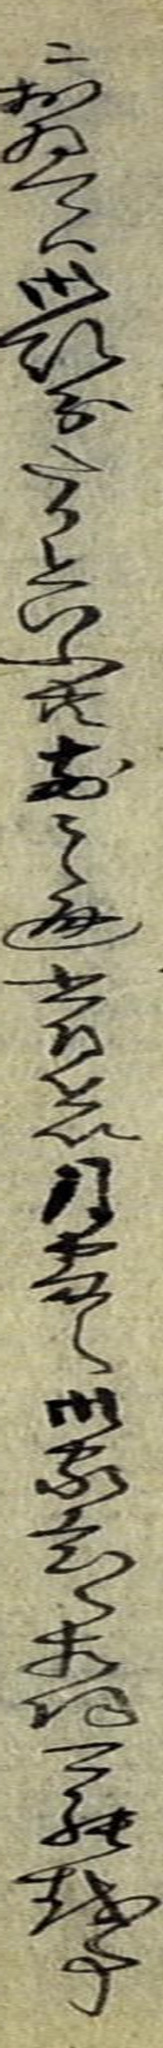ニおゐてハ御領分たりといふ共前々之通書付を以月番之御家老へ相伺可罷越事
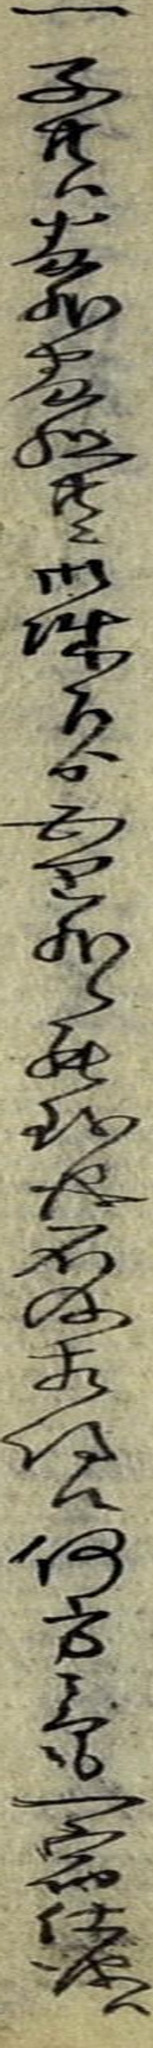一子共ハ番外番組共ニ御城下ゟ五里外へ罷越儀不及相伺候何方ニ而も一宿仕儀ハ
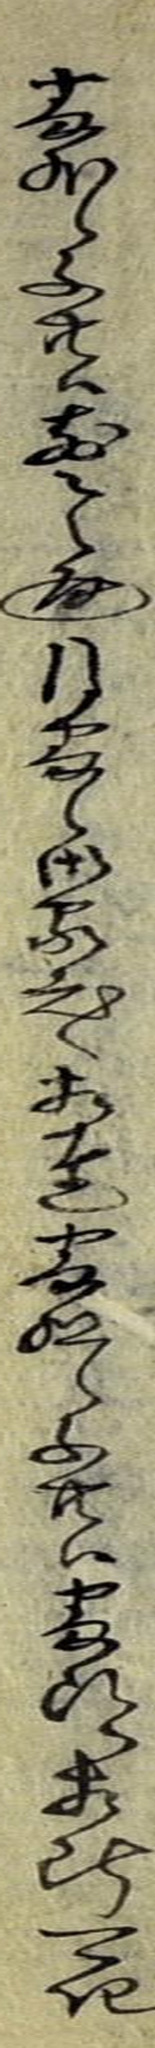番外之子共ハ前々之通月番之御家老へ相達番組之子共ハ番頭へ相断可任
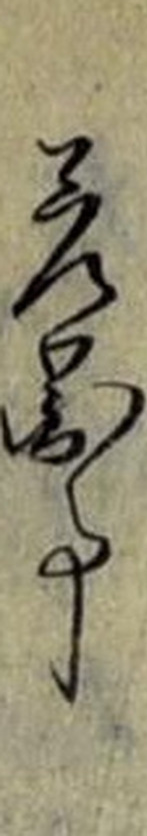差図事
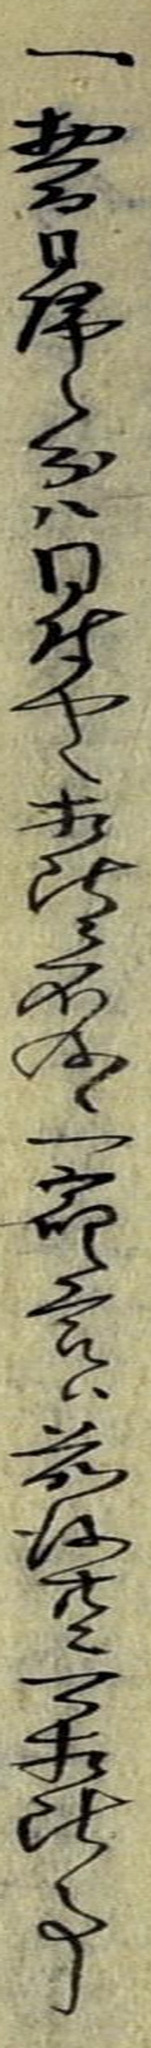一惣而日帰之分ハ目付中へ相断ニ不及候一宿之節ハ前後共ニ可相断事
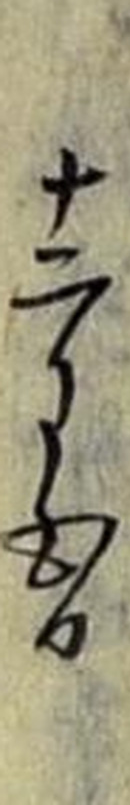十二月五日
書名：命令之部 一
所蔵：福井県文書館 Fukui Prefectural Archives
